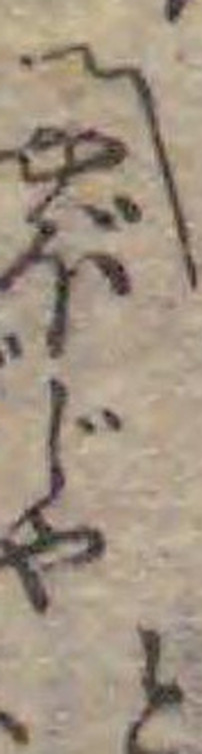〽やぼじや
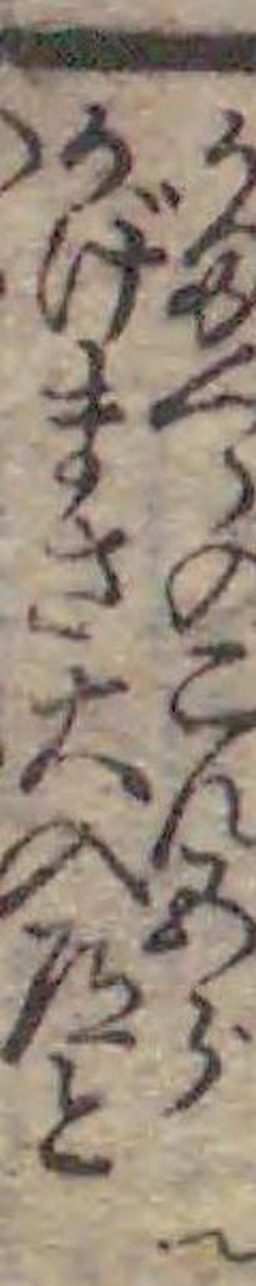かげまさ大入道と
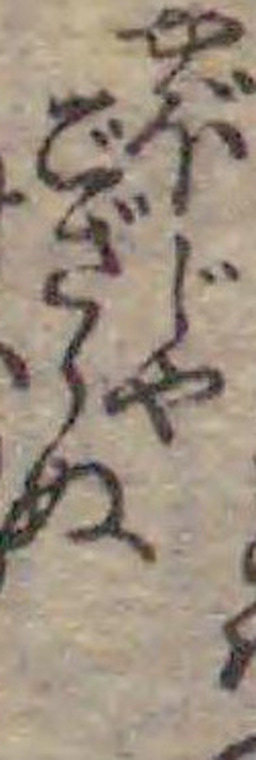ござらぬ
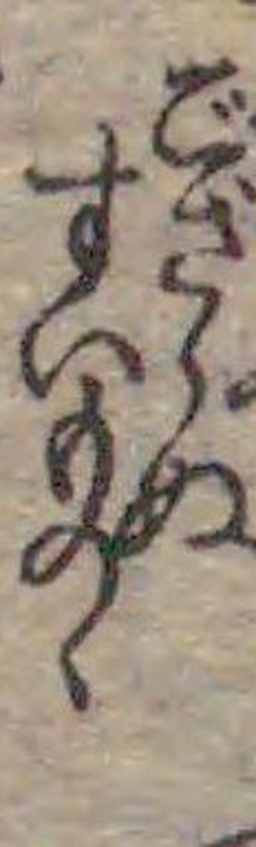すいものゝ
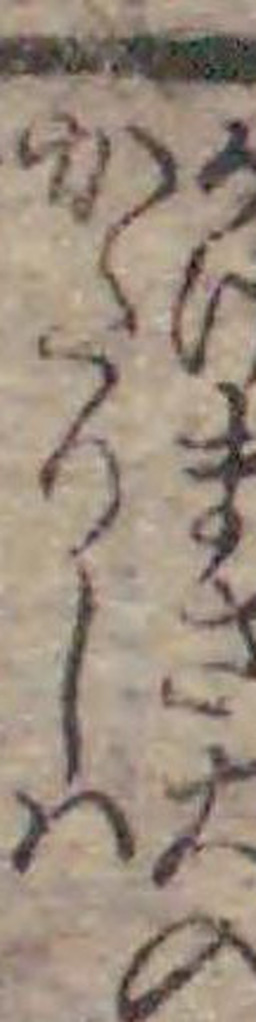かたりしは
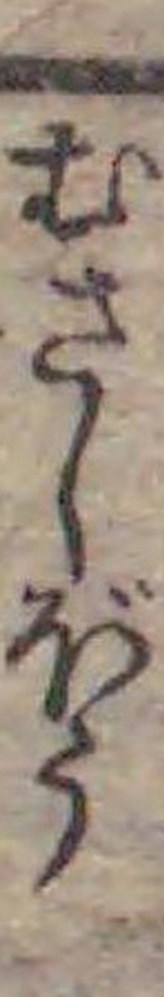むさしぼう
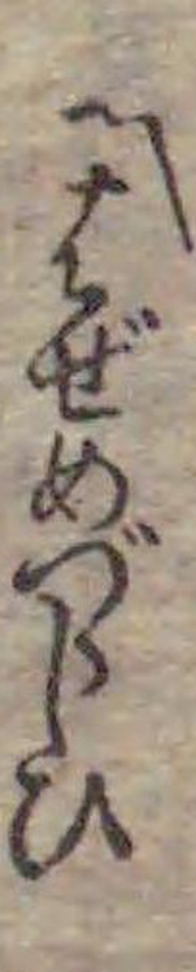〽はぜめづらしひ
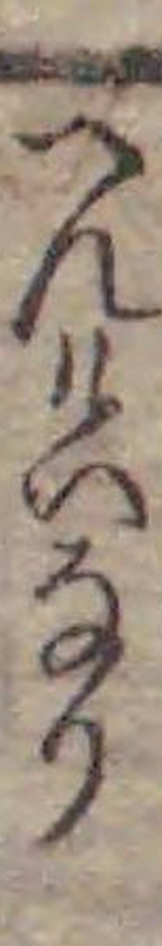へんけいなり

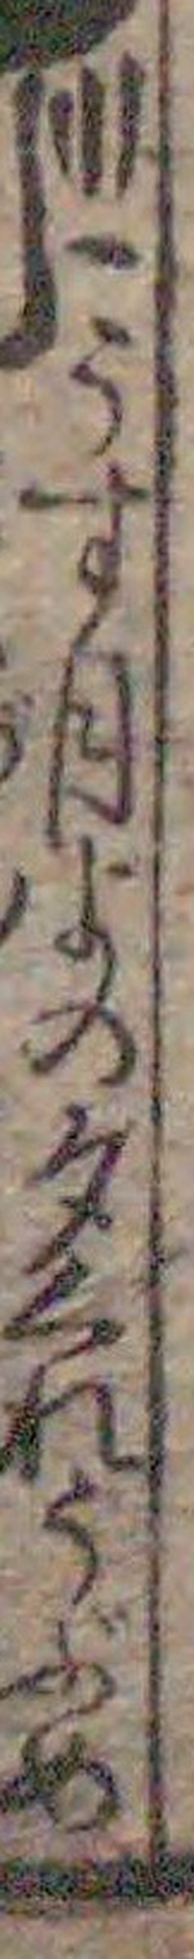うす月よの夕くれうぶめ
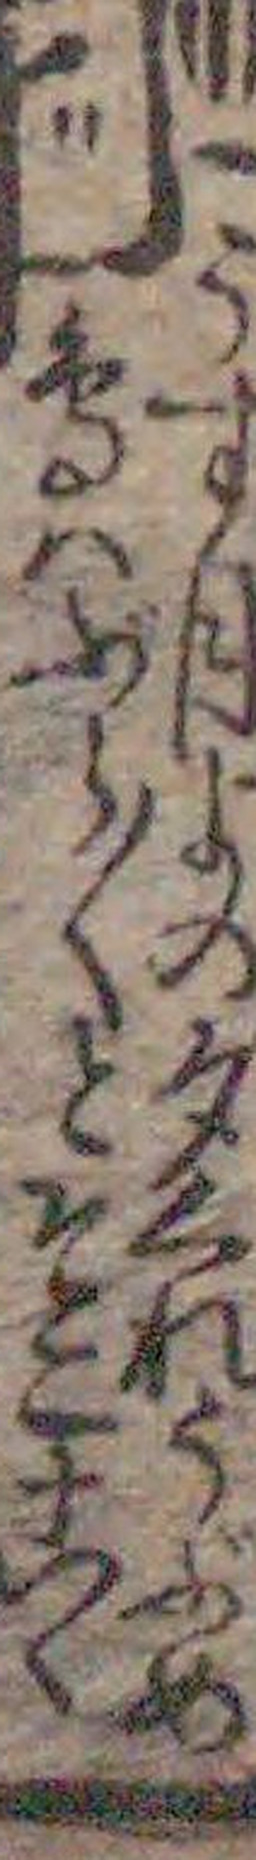鳥はぶら〳〵とそここゝ
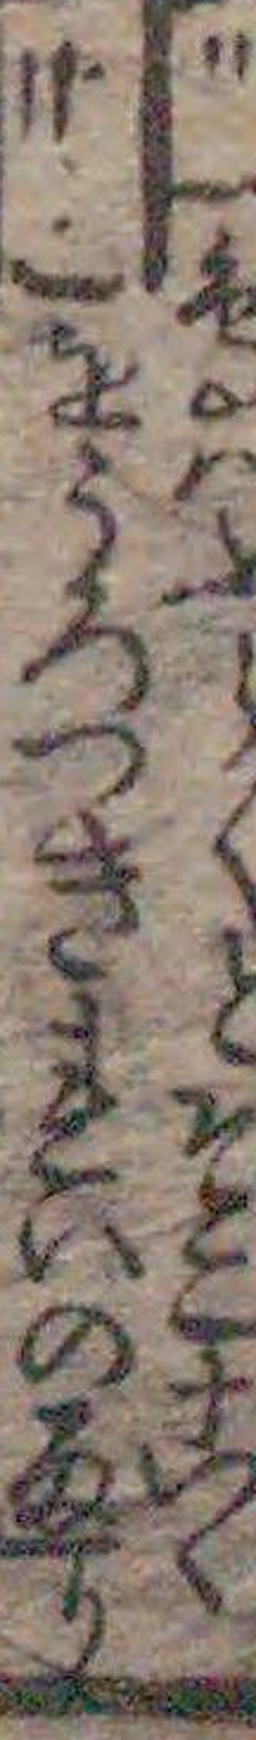をうろつきれいの通り
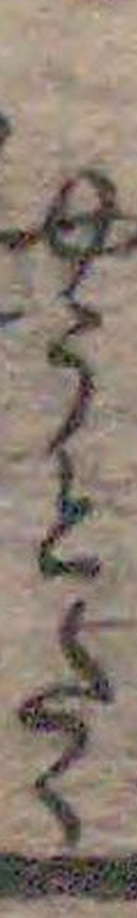やうとたく
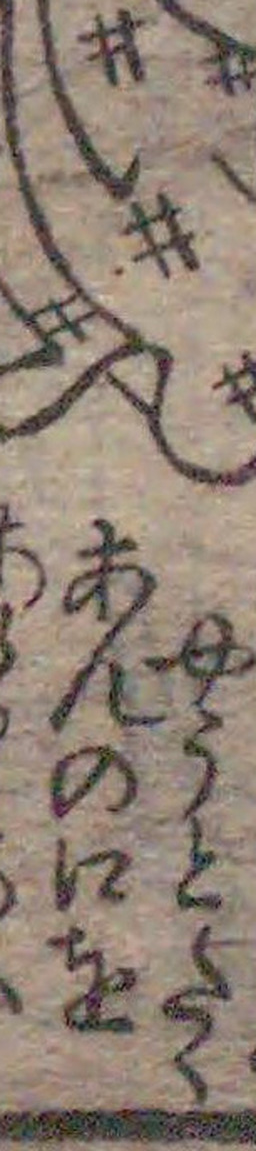あんのにを
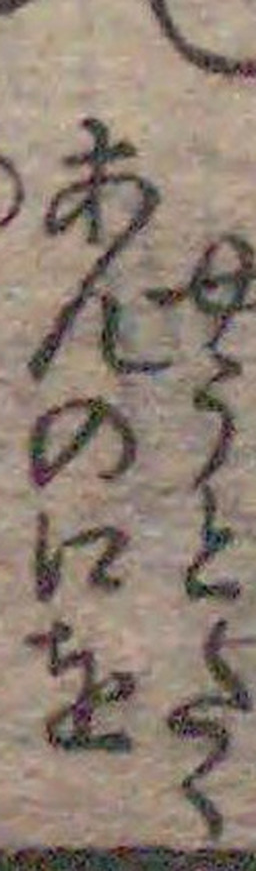あんのにを
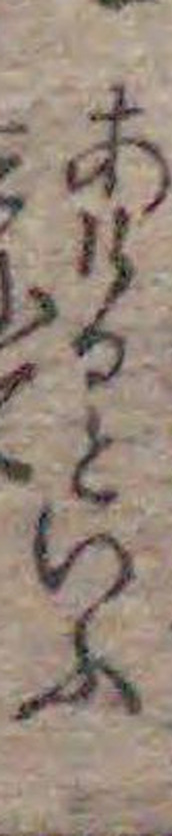あけるといふ
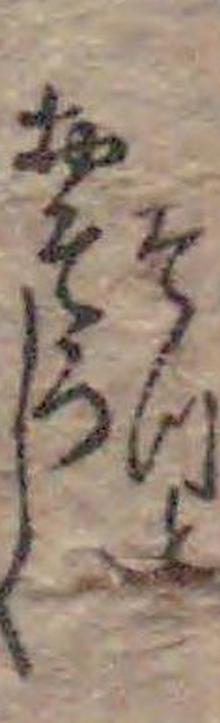おそろしく
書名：怪物つれつれ草 : 2巻
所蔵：国立国会図書館 National Diet Library, JAPAN
